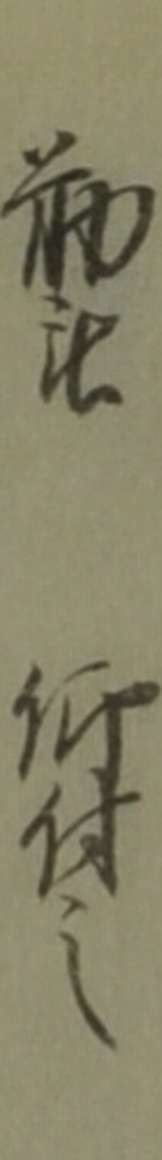勤被仰付之
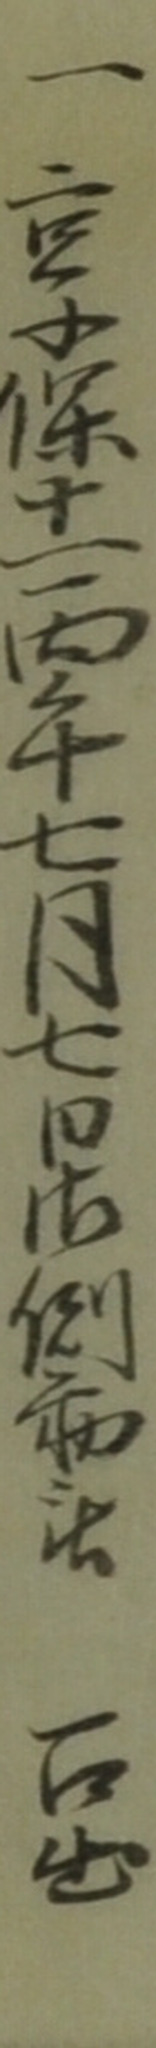一享保十一丙午七月七日御側勤被召出
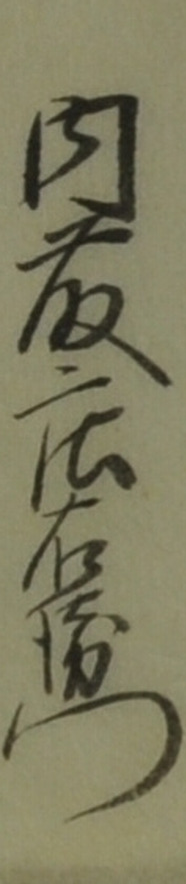内藤庄右衛門
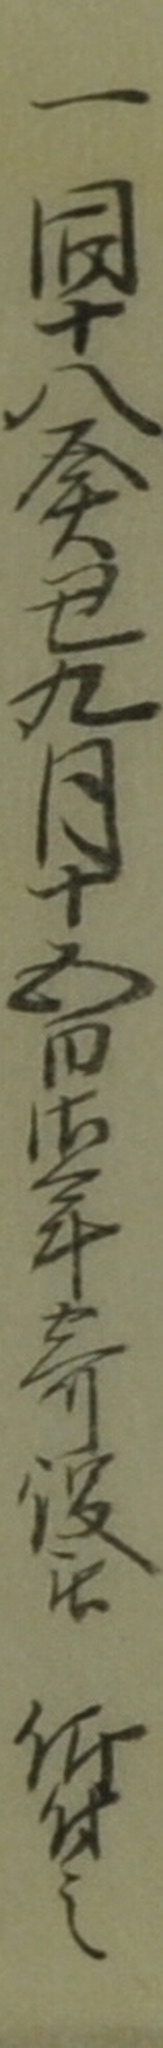一同十八癸丑九月十五日御年寄役被仰付之
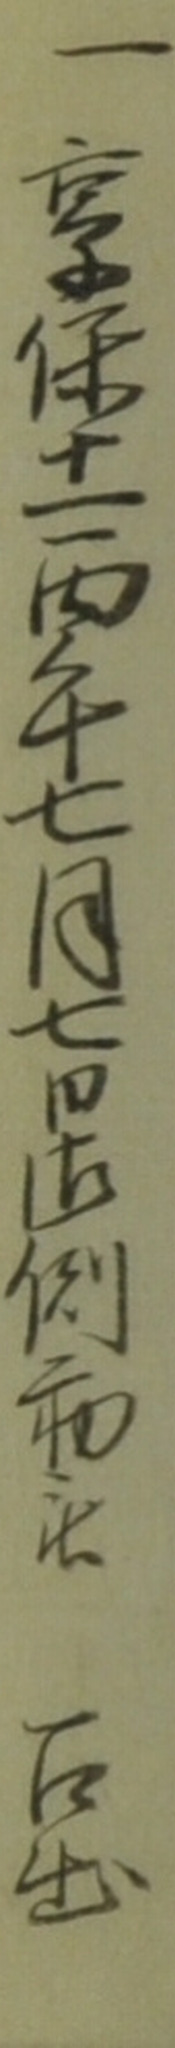一享保十一丙午七月七日御側勤被召出
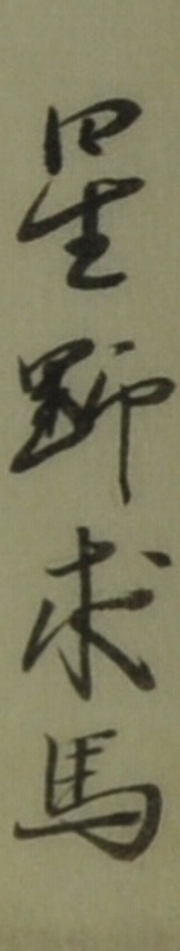星野求馬

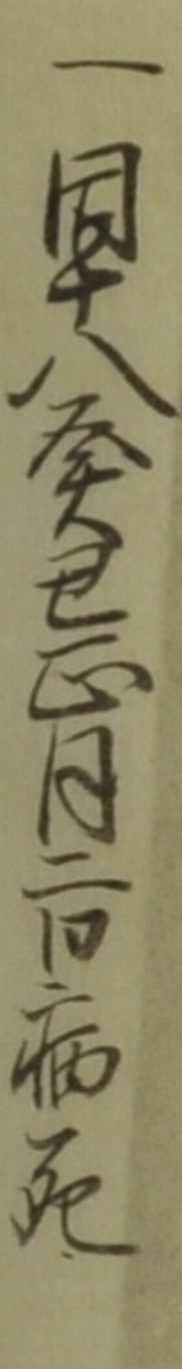一同十八癸丑正月二日病死
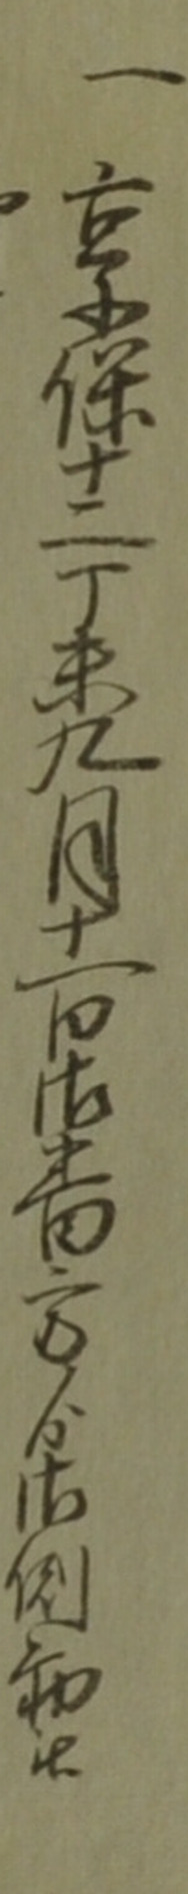一享保十二丁未九月十一日御番方ゟ御側勤被
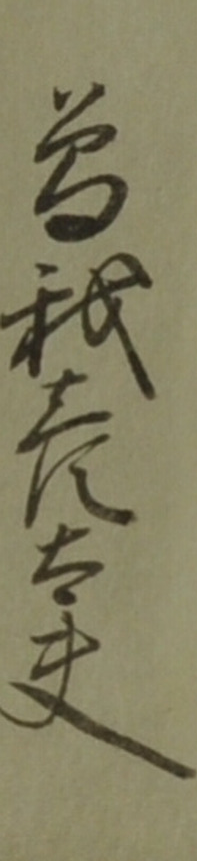曽我彦太夫
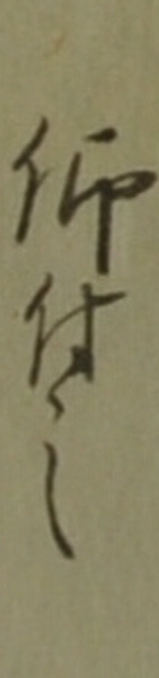仰付之
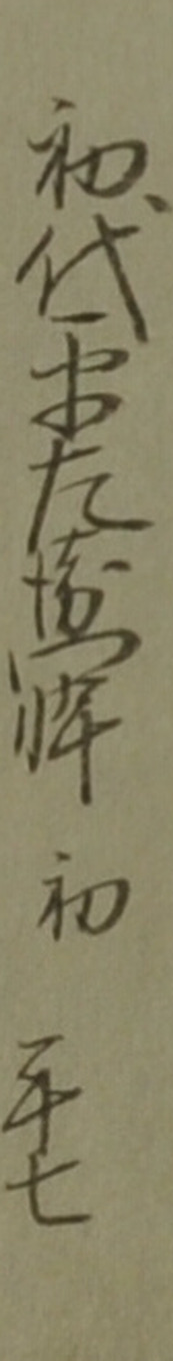初代平左衛門忰初平七
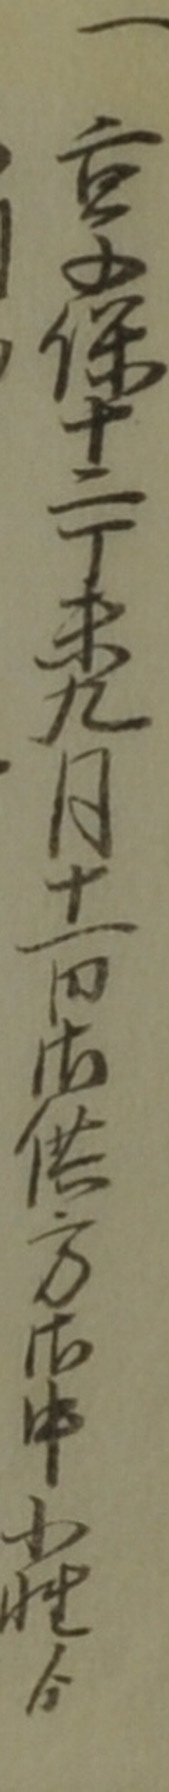一享保十二丁未九月十一日御供方御中小性ゟ
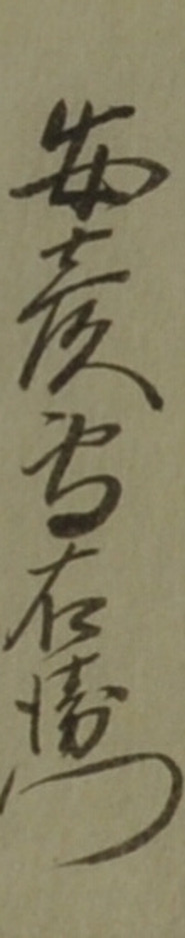安彦専右衛門
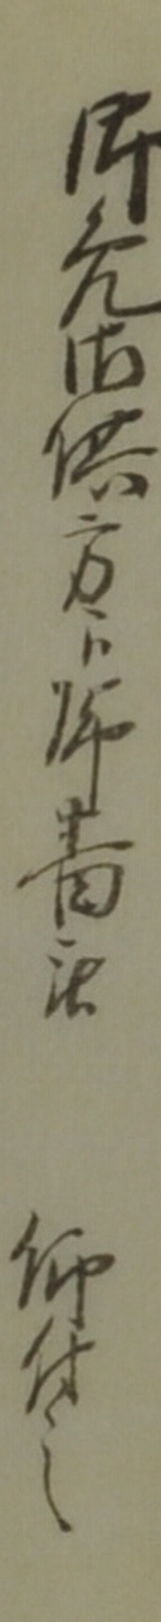御免御供方江帰番被仰付之
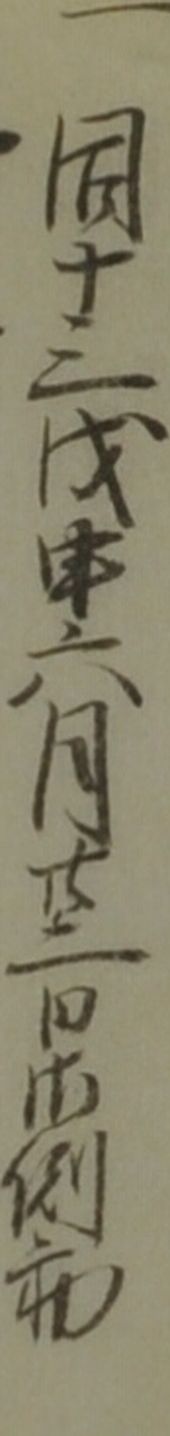一同十三戊申六月廿二日御側勤
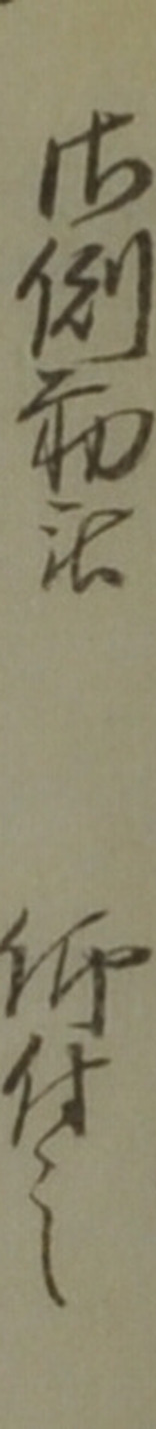御側勤被仰付之
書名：諸御役代々録（五）
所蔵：伊那市立高遠町図書館・合同会社AMANE
